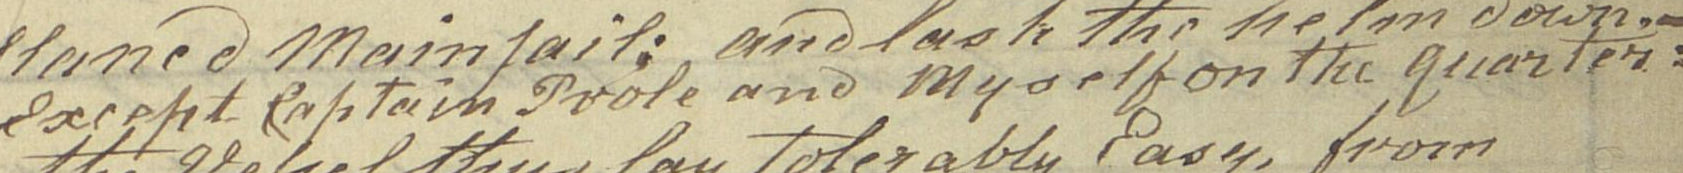Except Captain Prole and Myself on the quarter:
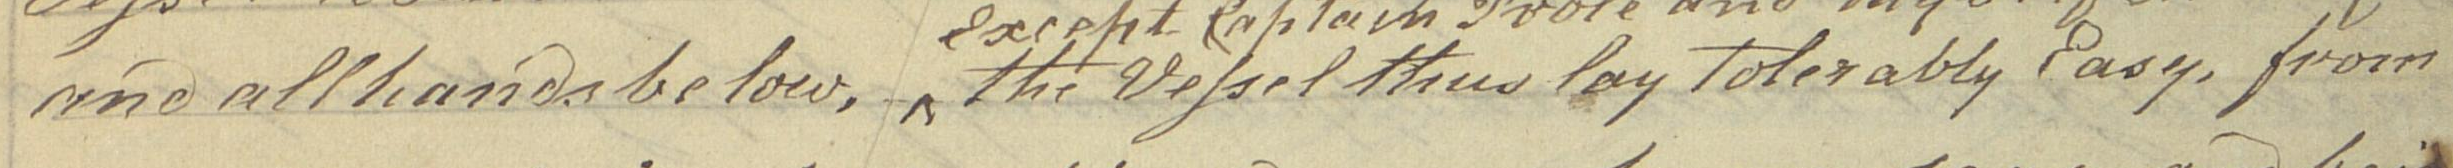and all hands below ^ the Vessel thus lay tolerably Easy, from
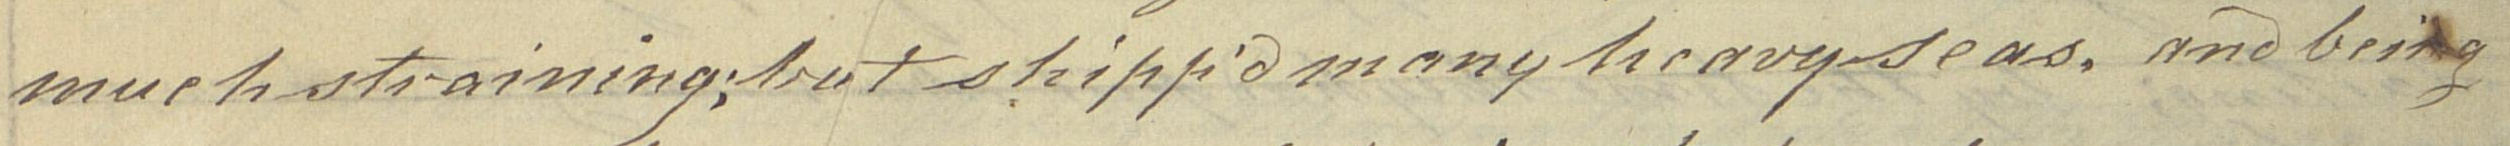much straining, but shipp'd many heavy seas, and being
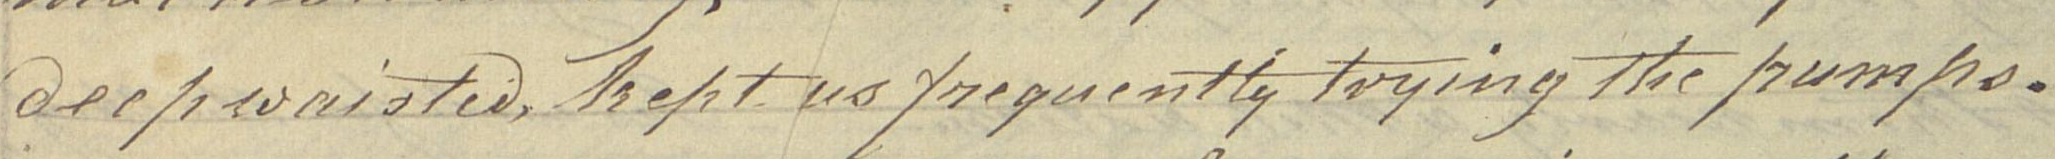deep waisted, kept us frequently trying the pumps
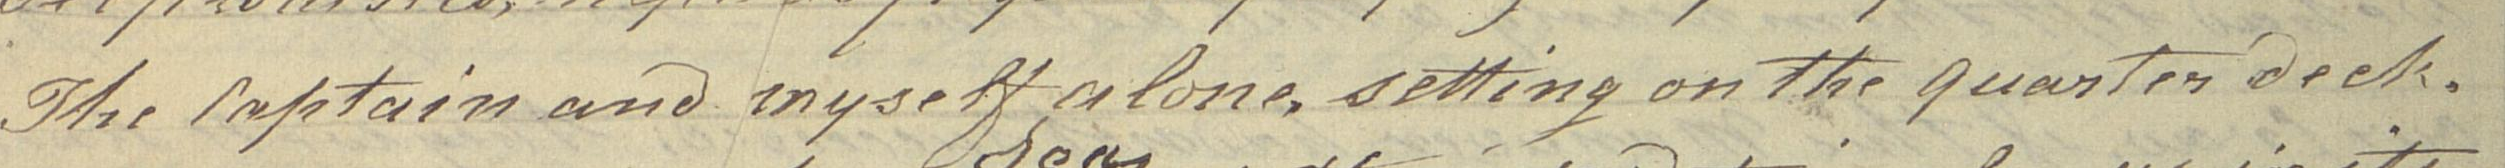The Captain and myself alone, setting on the quarter deck.
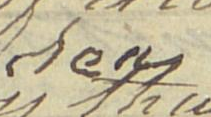sery
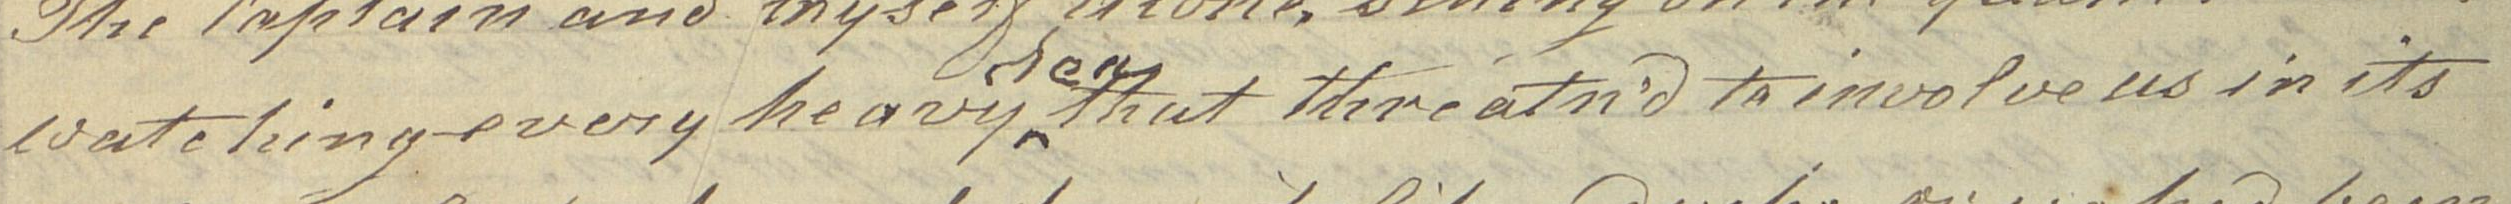watching every heavy ^ that threatn'd to involve us in its
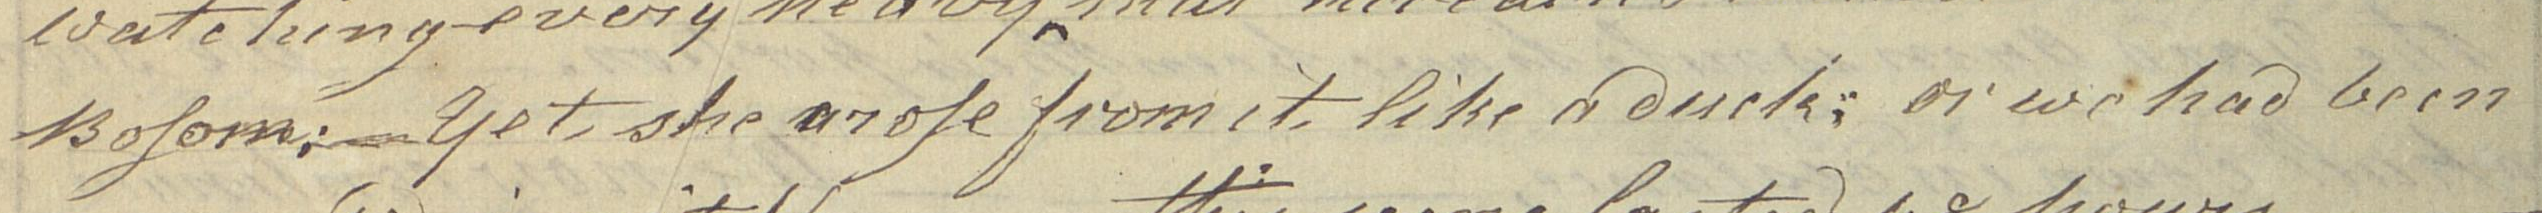Bosom: yet she arose from it like a duck; or we had been
